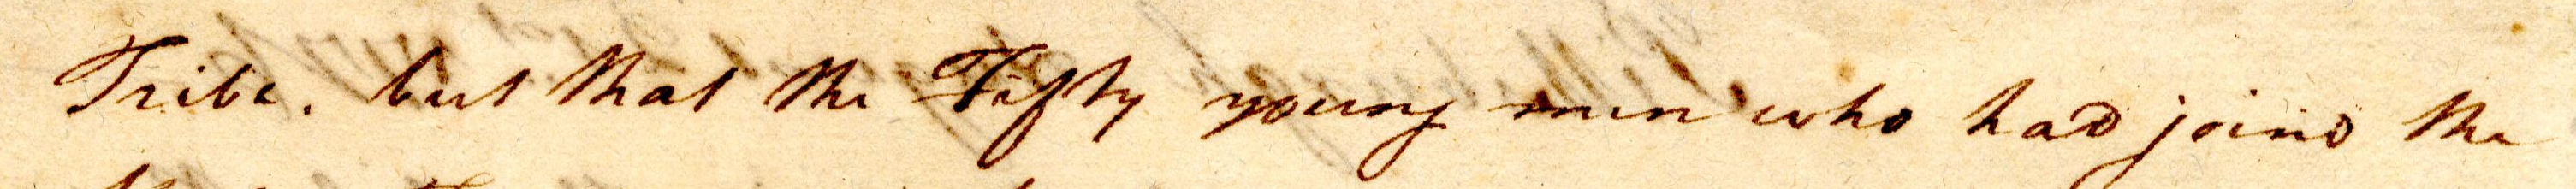Tribe, but that the Fifty young men who had joind the
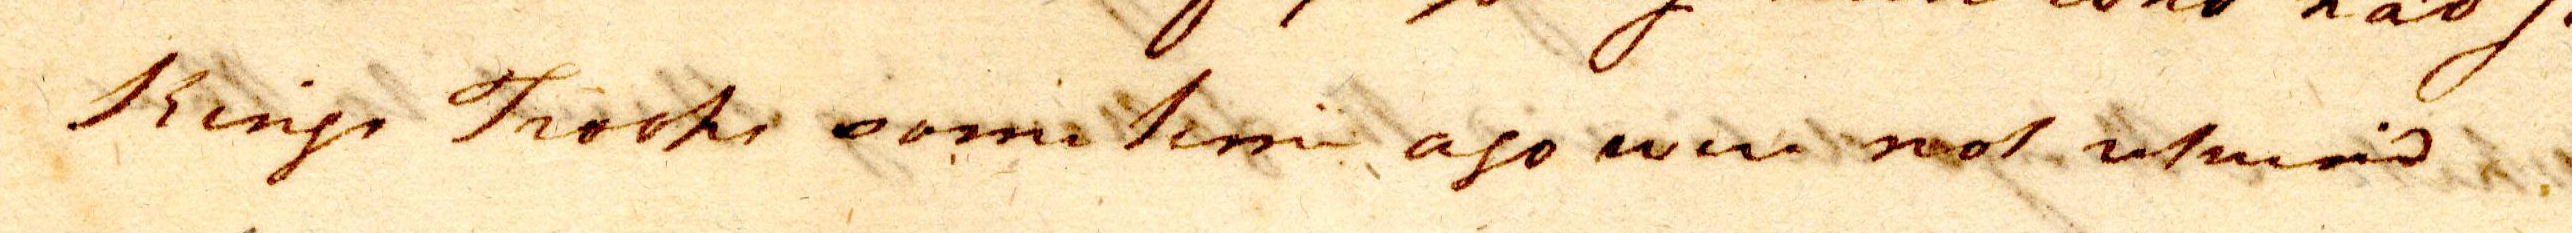Kings Troops some time ago were not return'd
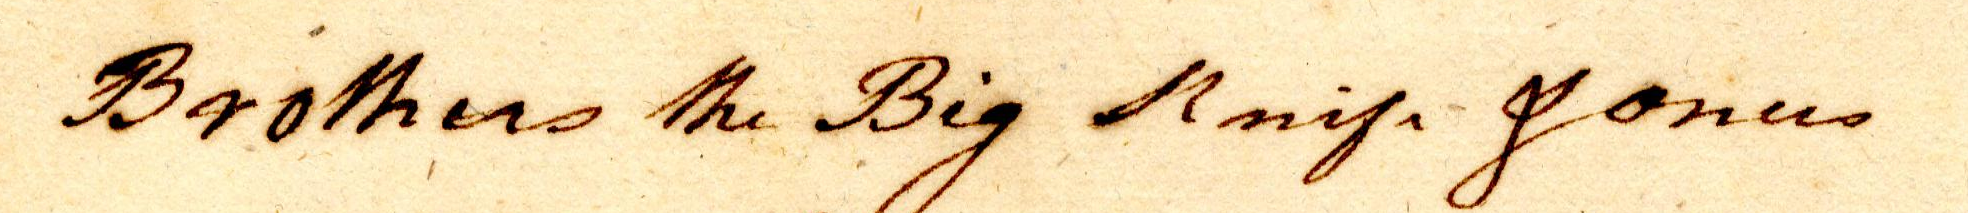Brothers the Big Knife & oners
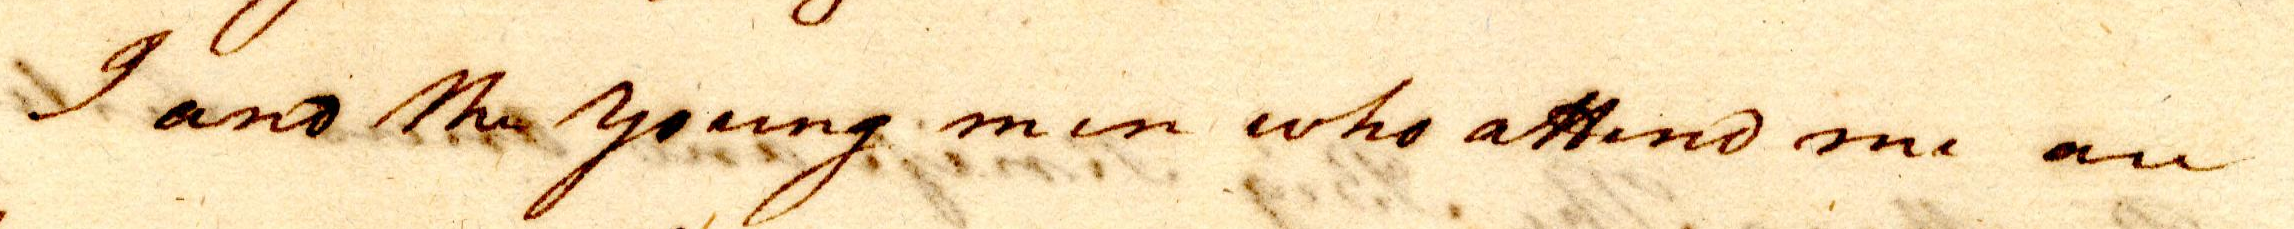I and the young men who attend me are
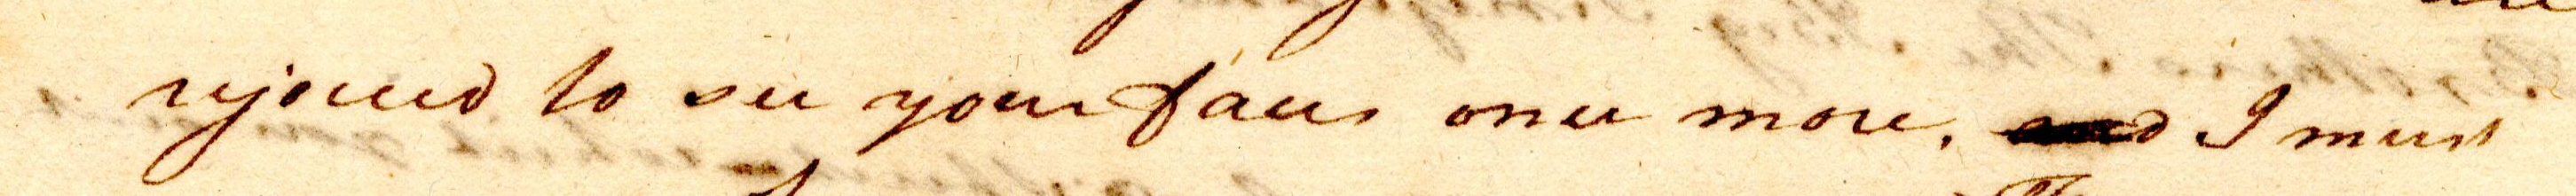rejoiced to see your faces once more, [and] I must
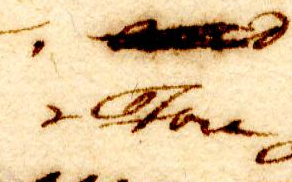Fore
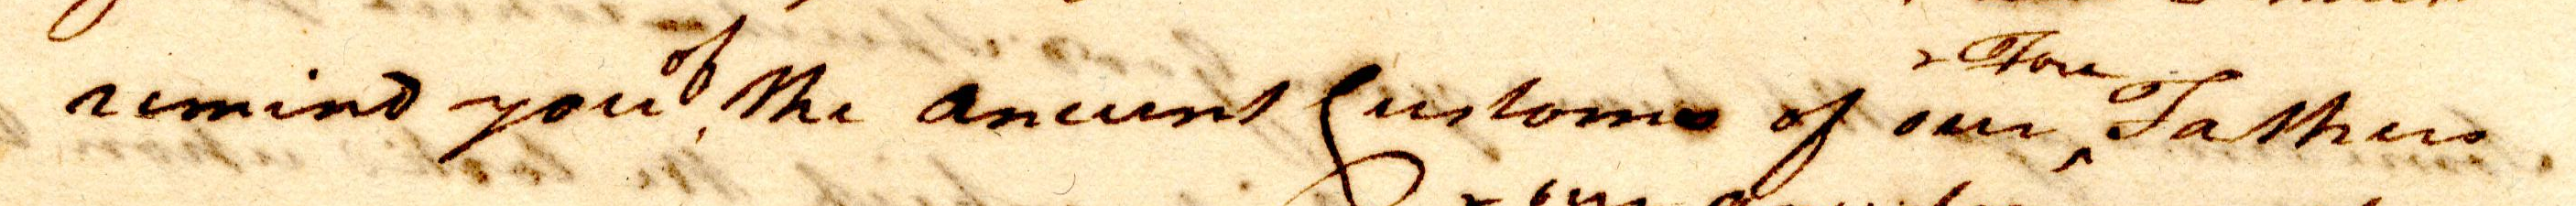remind you ^of the ancient Custom of our ^ Fathers
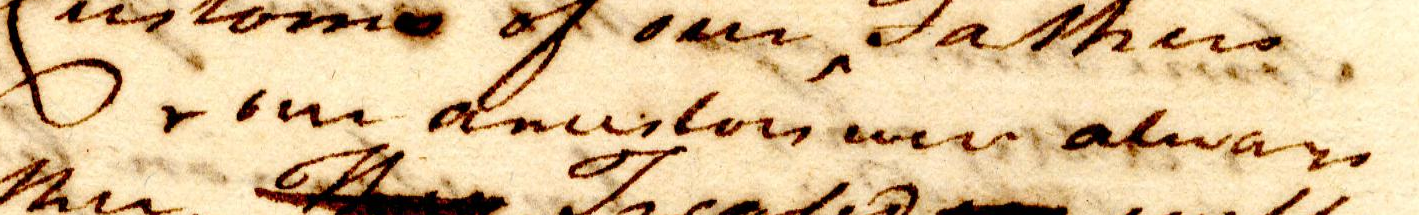our ancestors were always
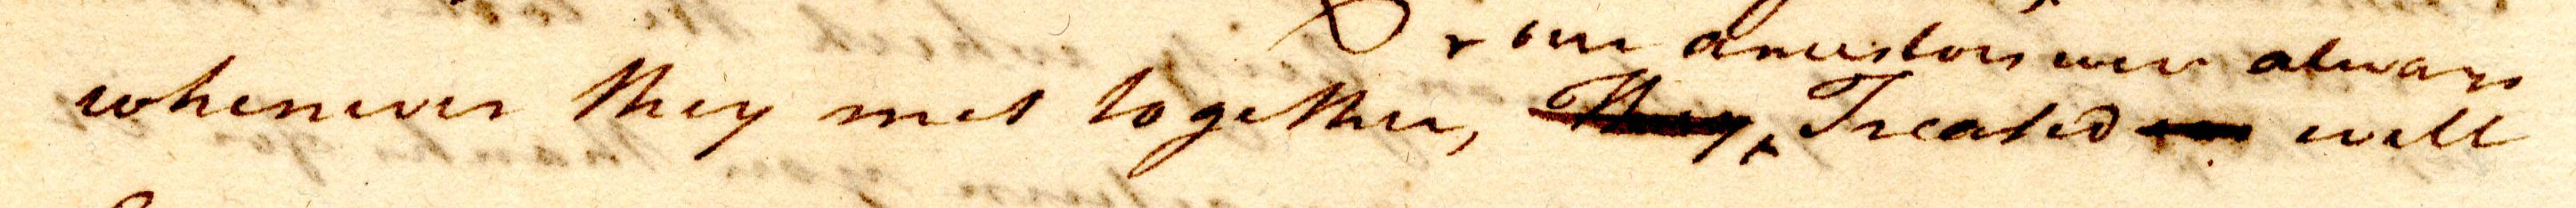whenever they met together, [they] ^ Treated [__] well
